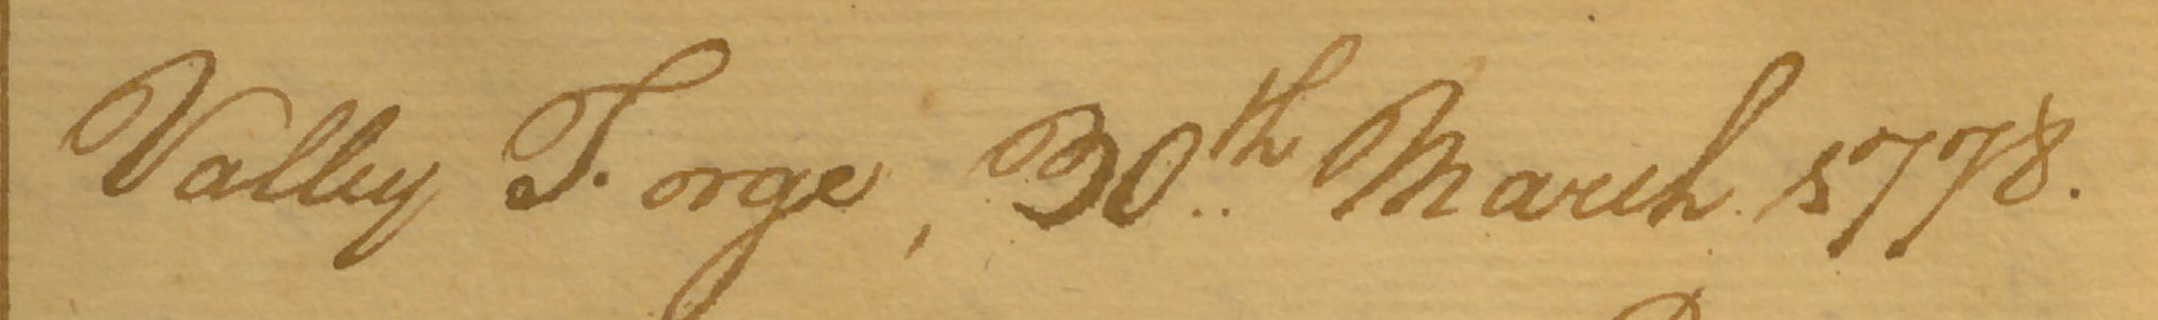Valley Forge, 30^th. March 1778.
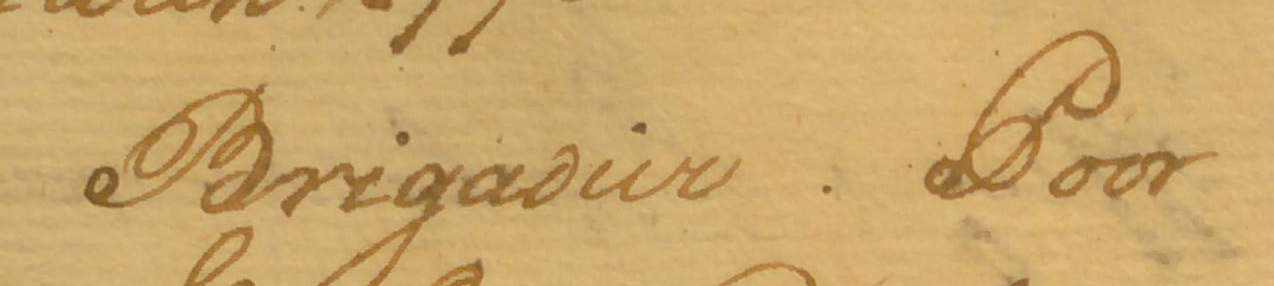Brigadier. Poor
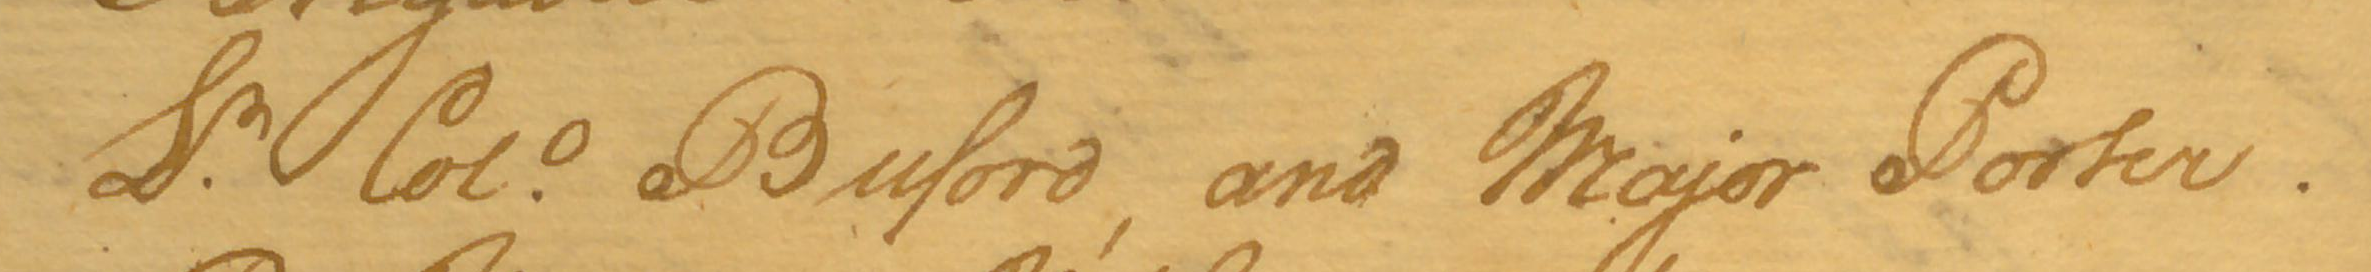L^t. Col^o. Buford, and Major Porter.
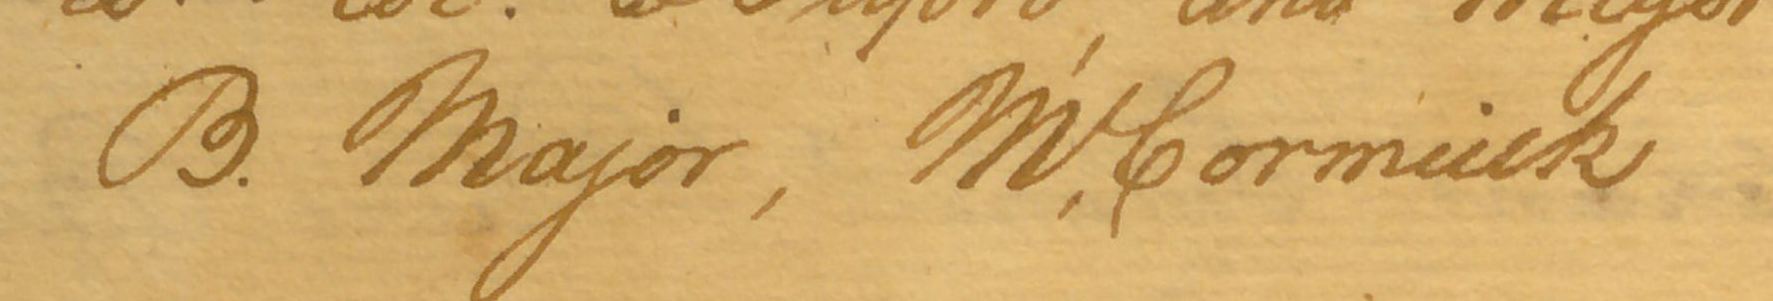B. Major, M^c.Cormick
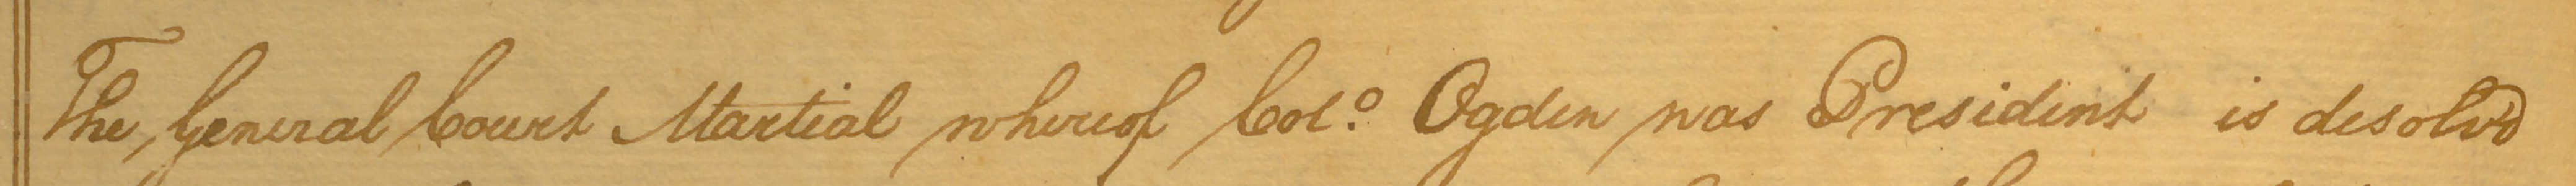The General Court Martial whereof Col^o. Ogden was President is disolv'd
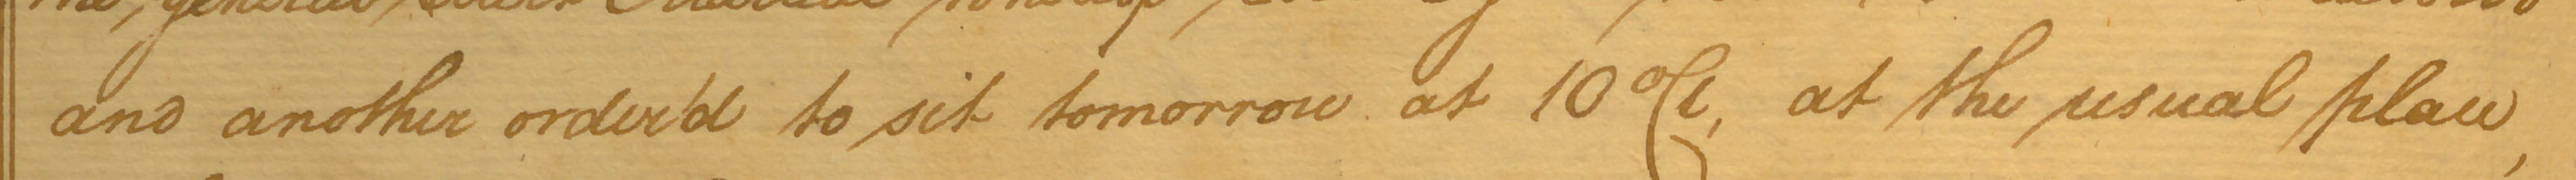and another order'd to sit tomorrow at 10 ^oCl, at the usual place
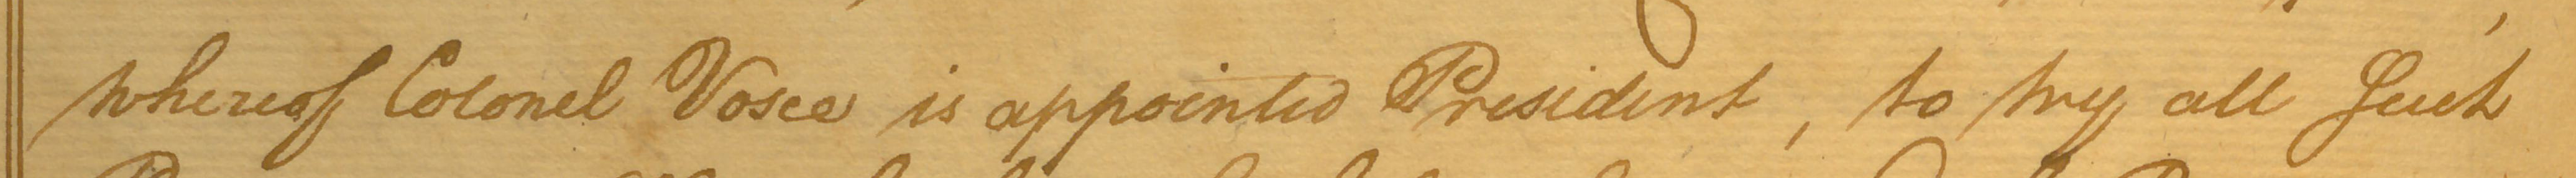whereof Colonel Vosce is appointed President, to try all such
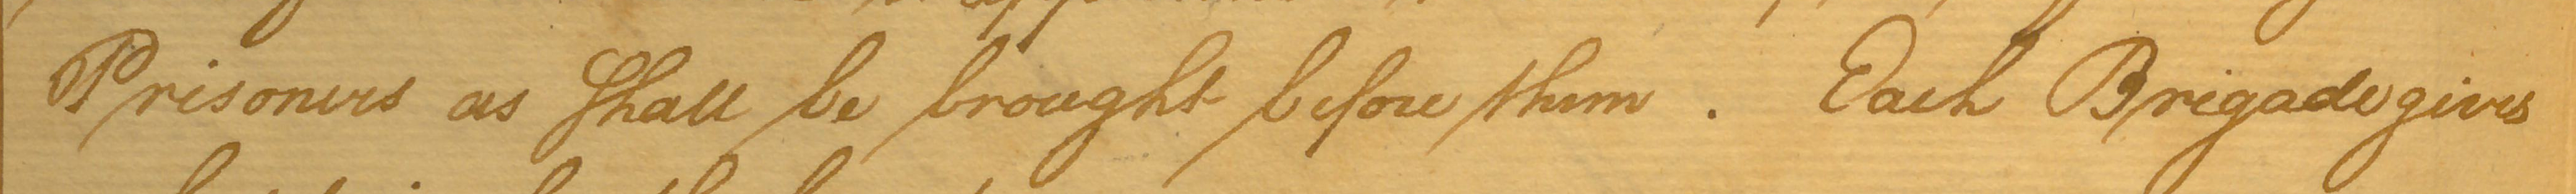Prisoners as shall be brought before them. Each Brigade gives
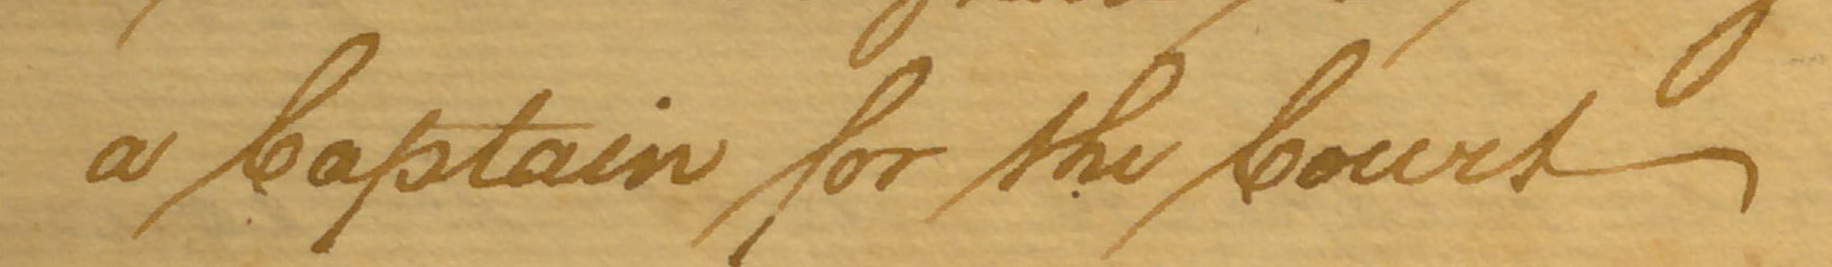a Captain for the Court-
